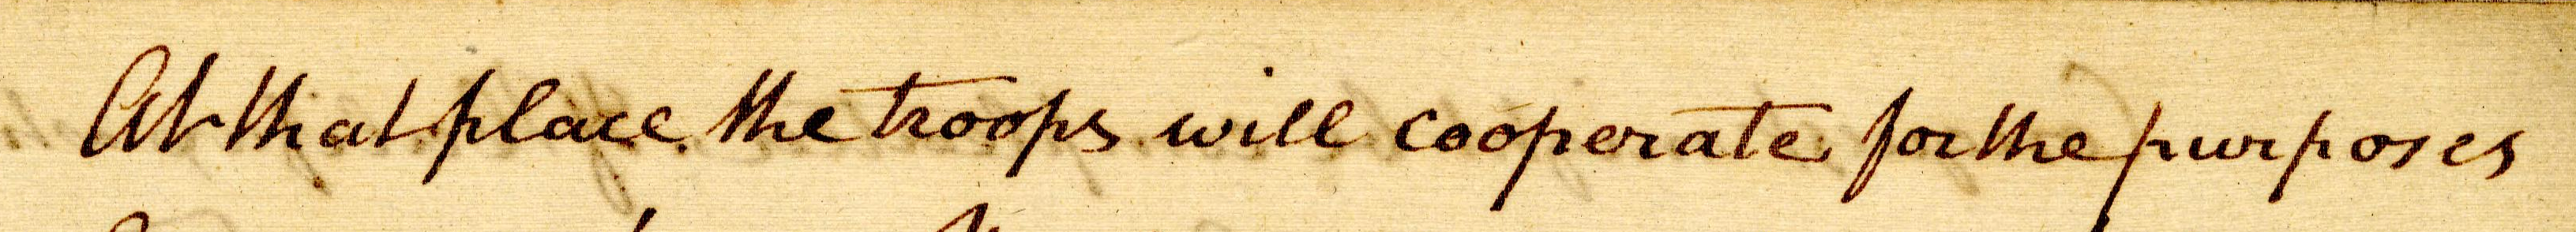At that place the troops will cooperate for the purposes
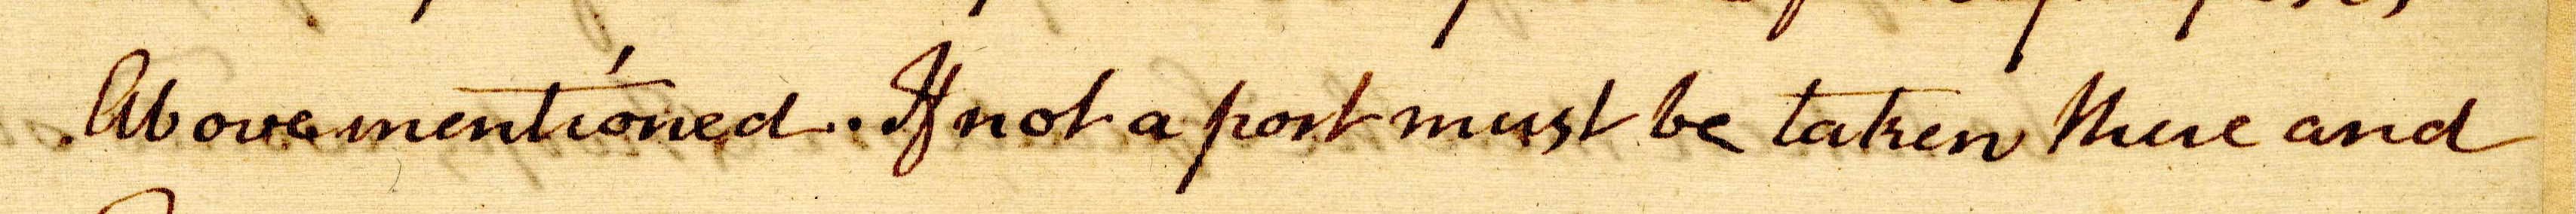Above mentioned. If not a post must be taken there and
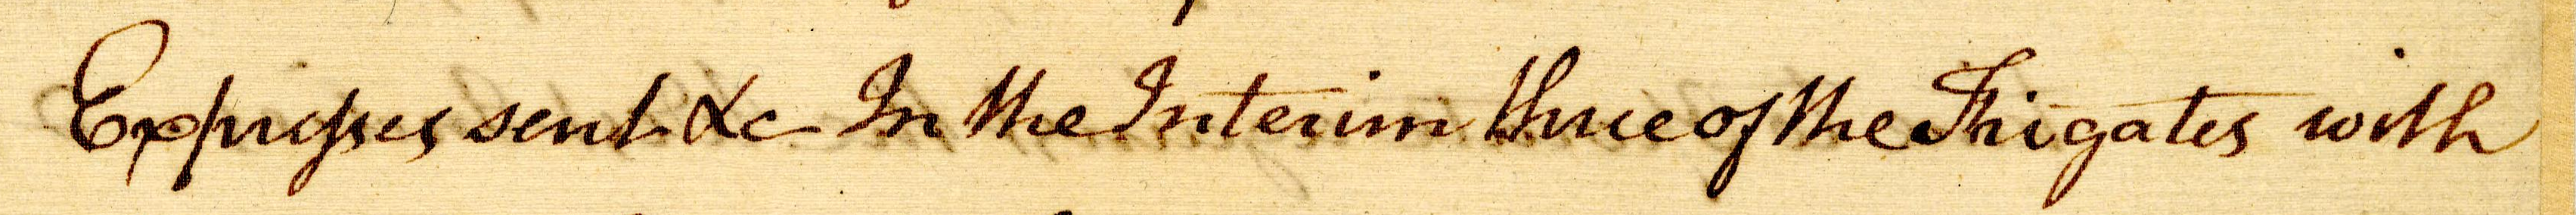Expresses sent &c In the Interim three of the Frigates with
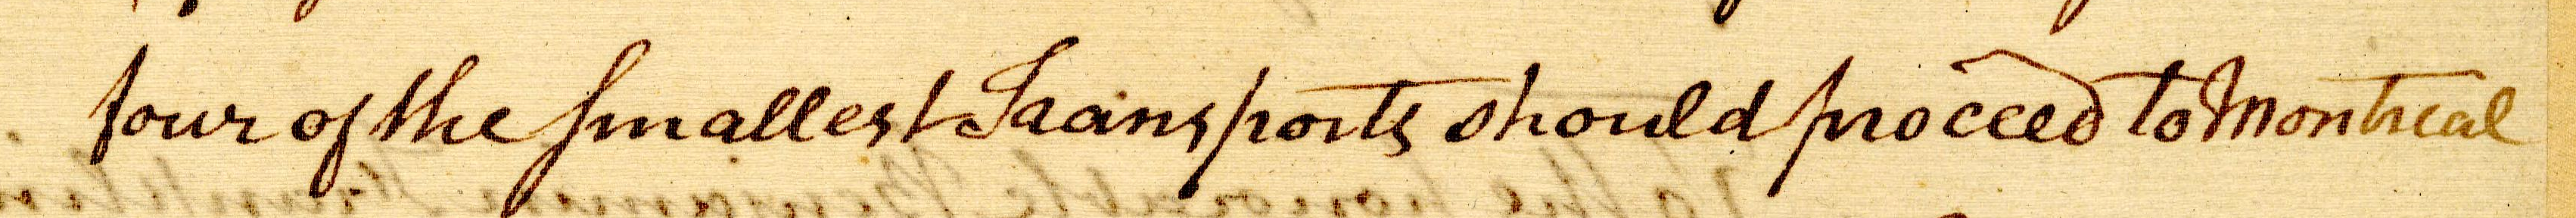four of the smallest Transports should proceed to Montreal
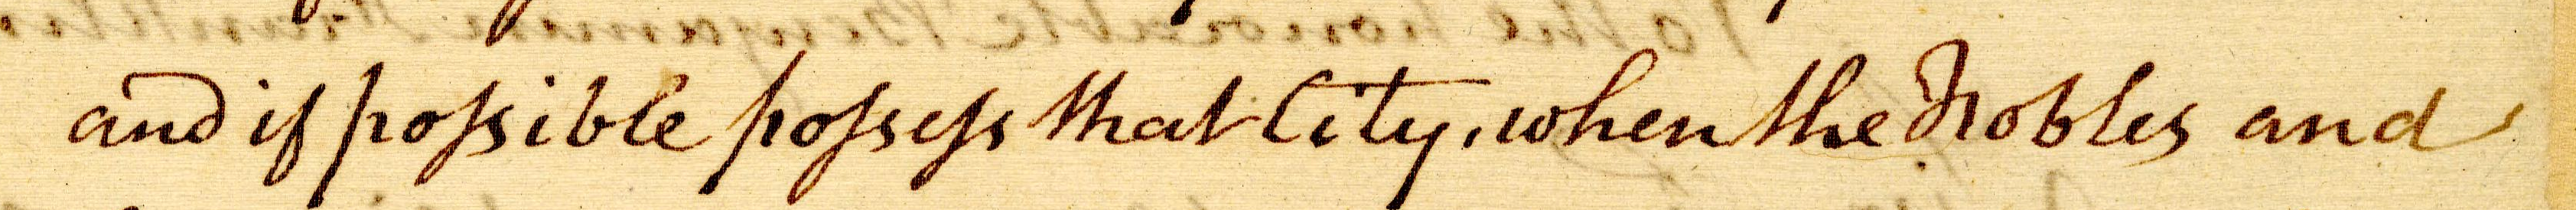and if possible possess that City, when the Nobles and
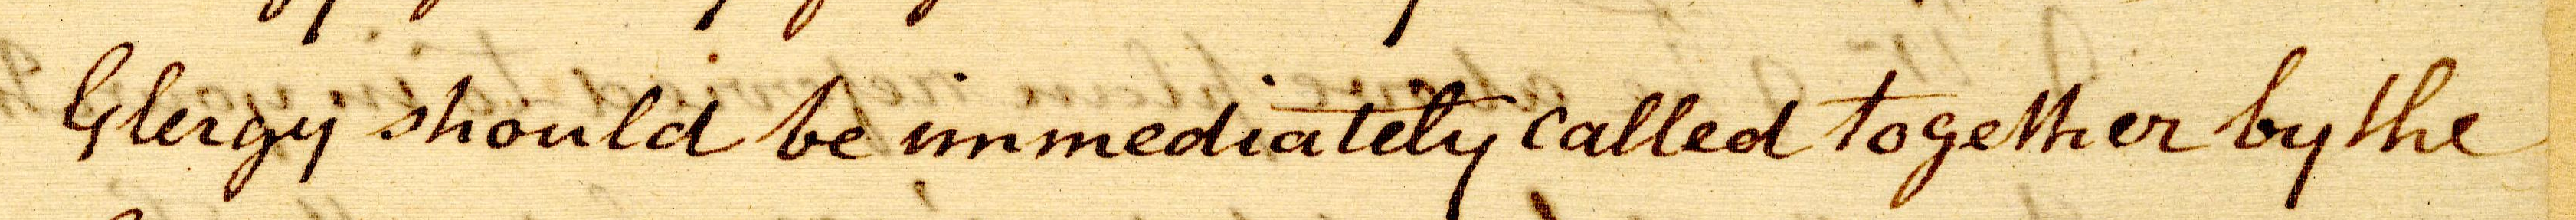Clergy should be immediately called together by the
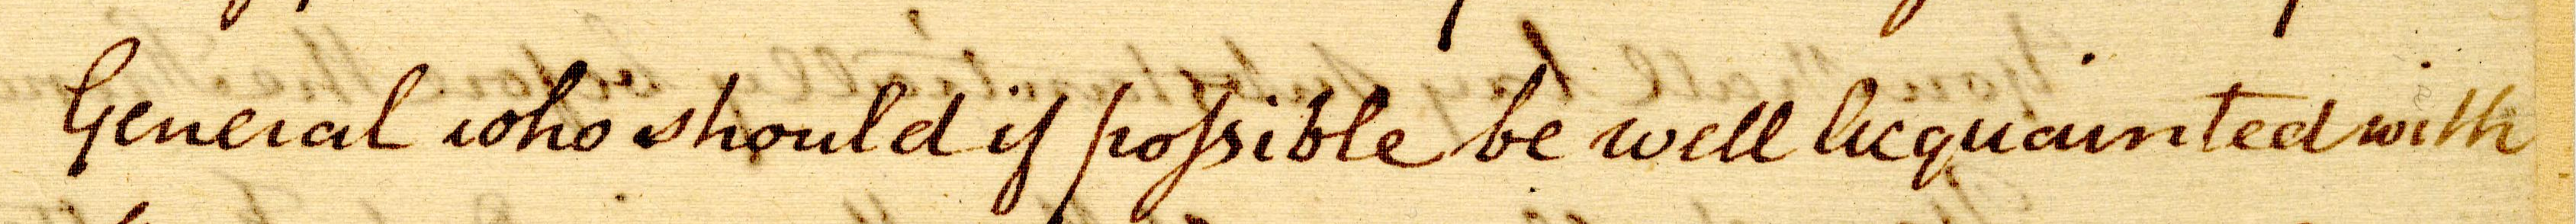General who should if possible be well Acquainted with
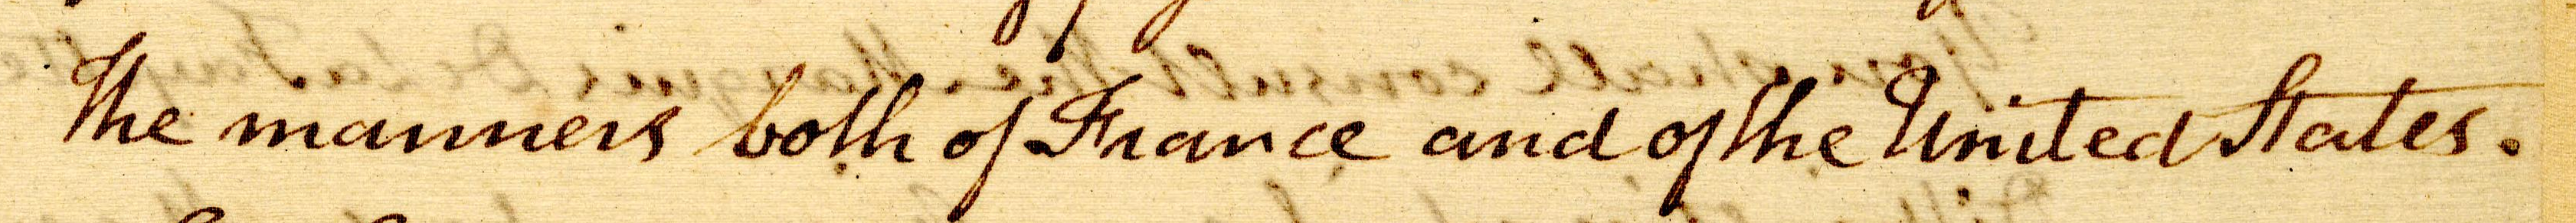The manners both of France and of the United States.
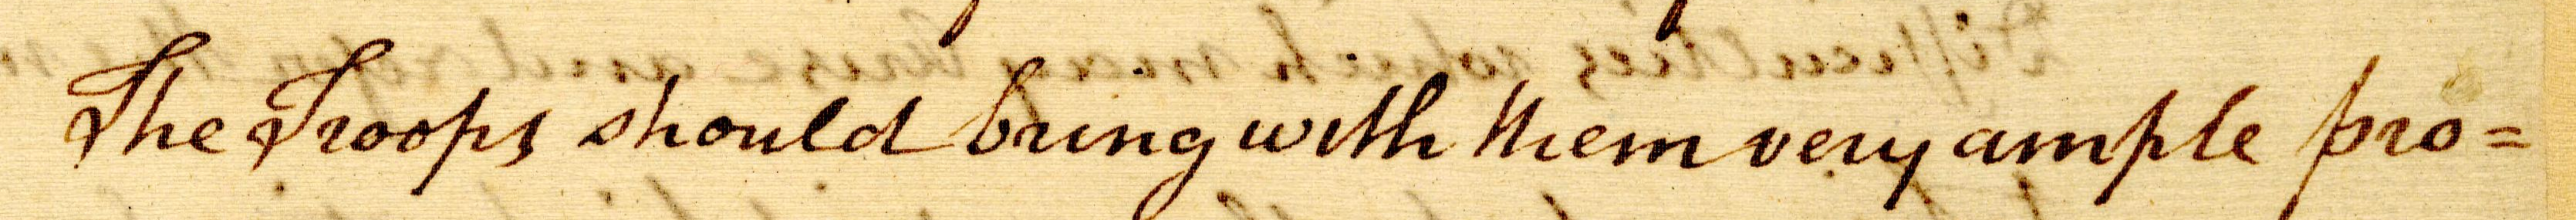The Troops should bring with them very ample pro-
